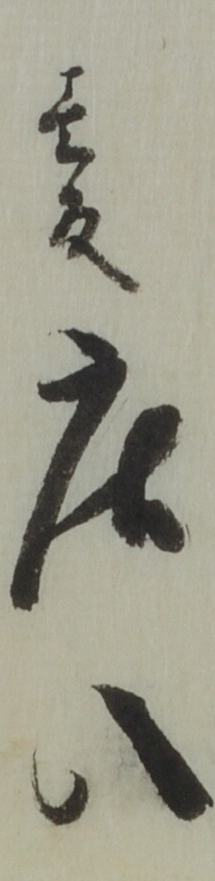壱反庄八
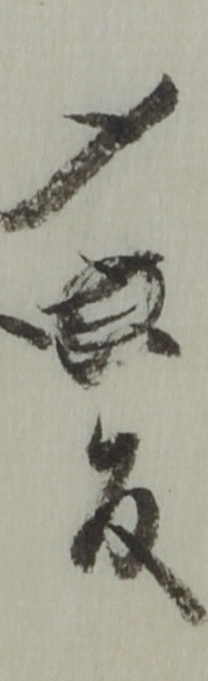〆五反
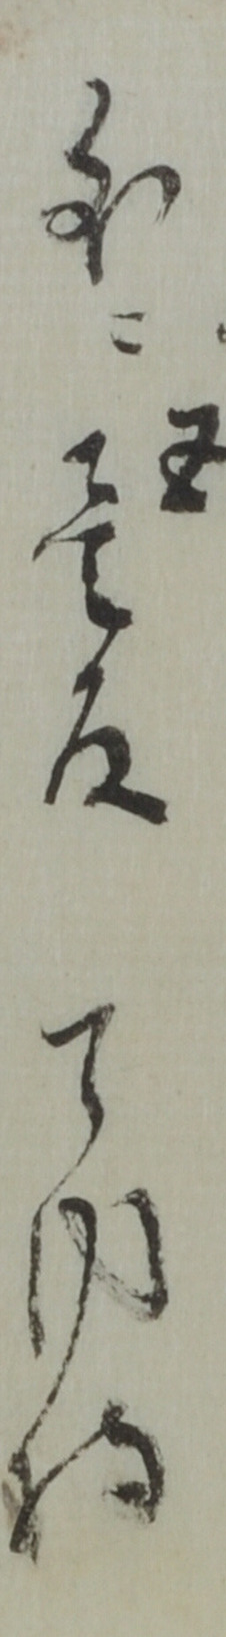外ニ壱反町内持
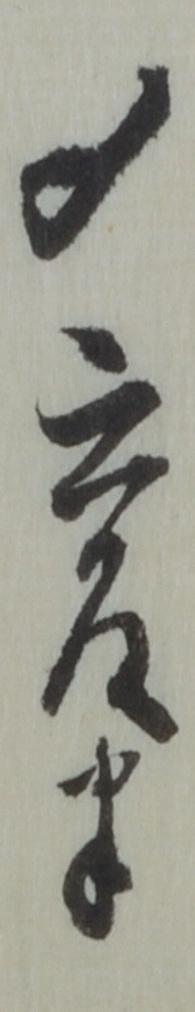〆六反半

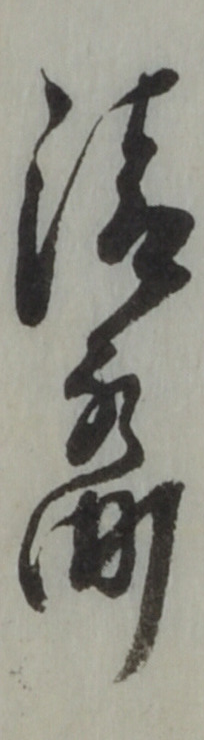清水町
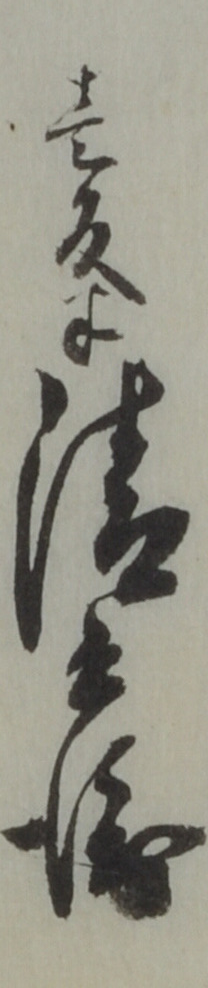壱反半清兵衛
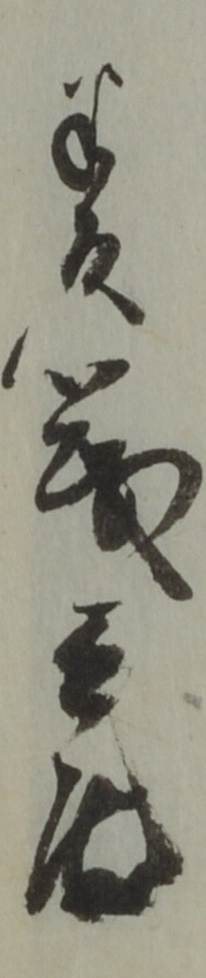半反義兵衛
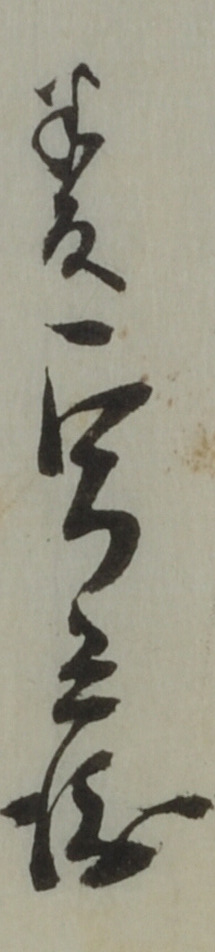半反宇兵衛
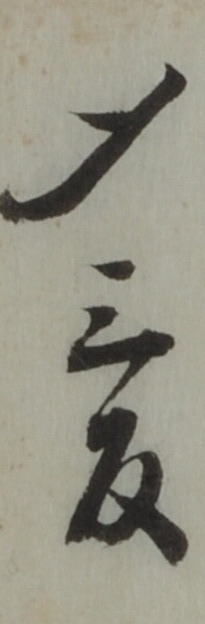〆三反
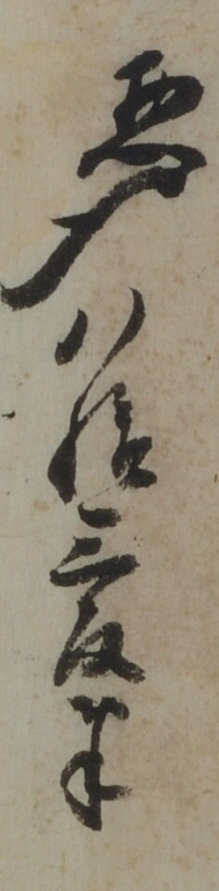惣〆八拾三反半
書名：融通割合帳
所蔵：伊那市立高遠町図書館・合同会社AMANE
